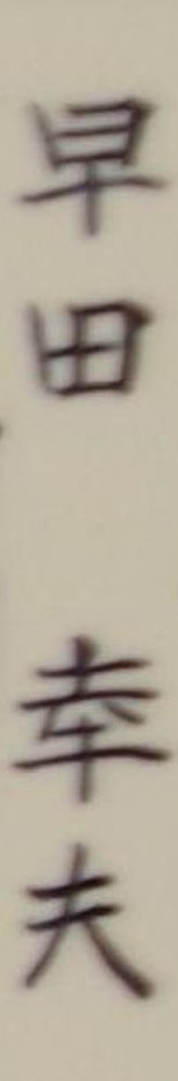早田幸夫
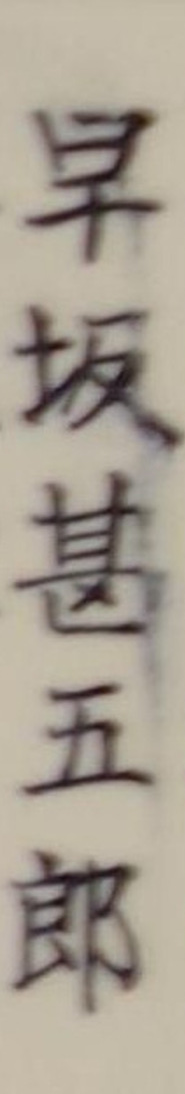早坂甚五郎
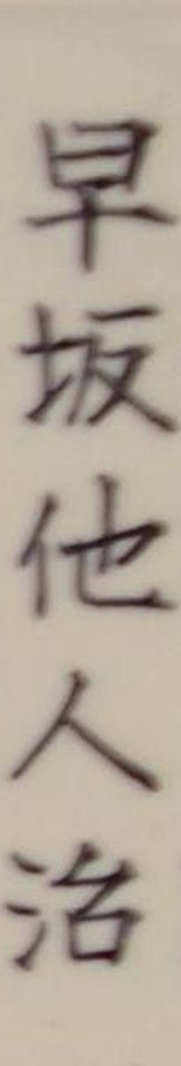早坂他人治
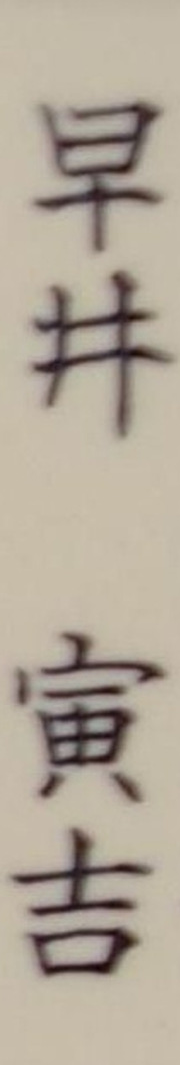早井寅吉
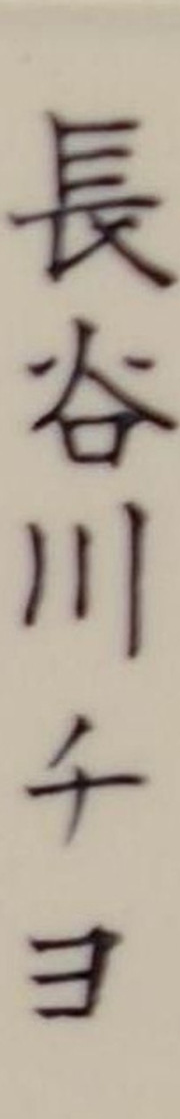長谷川チヨ
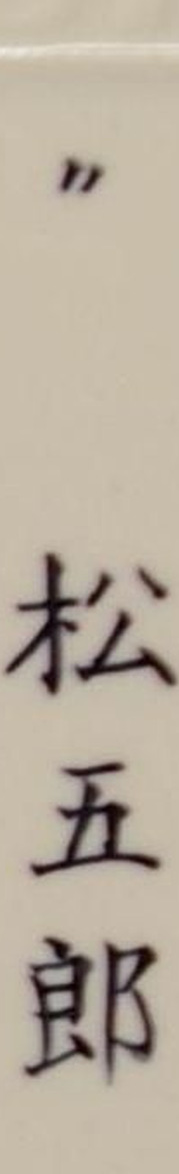松五郎
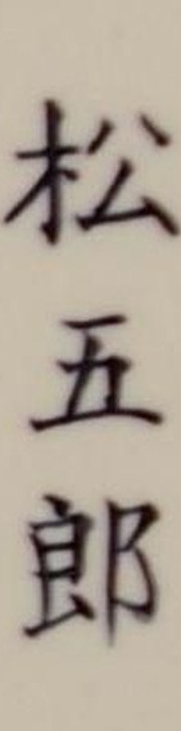松五郎
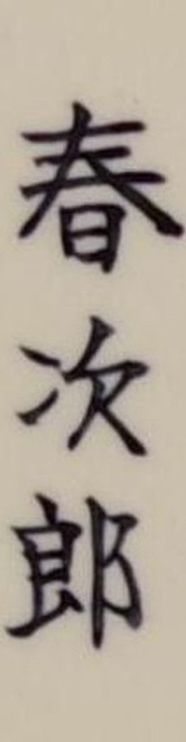春次郎
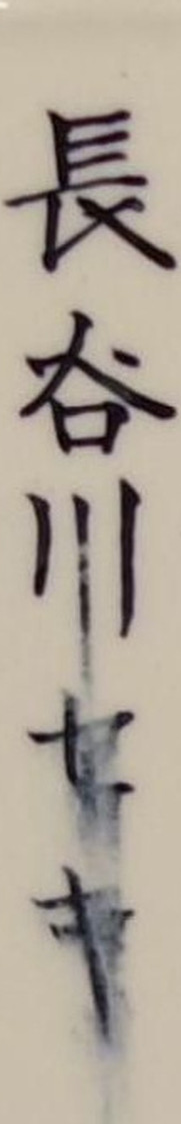長谷川セキ

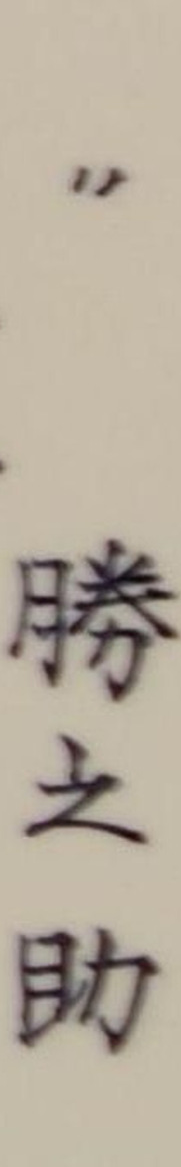勝之助
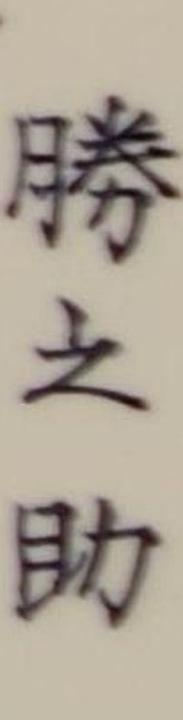勝之助
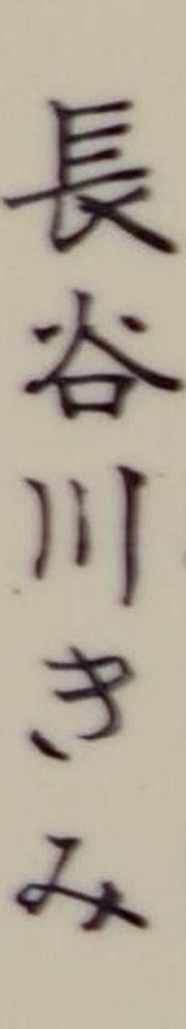長谷川きみ
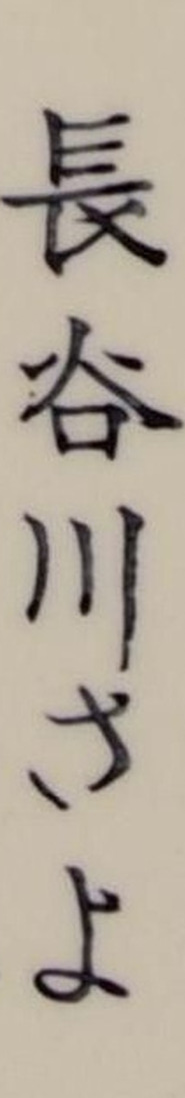長谷川さよ

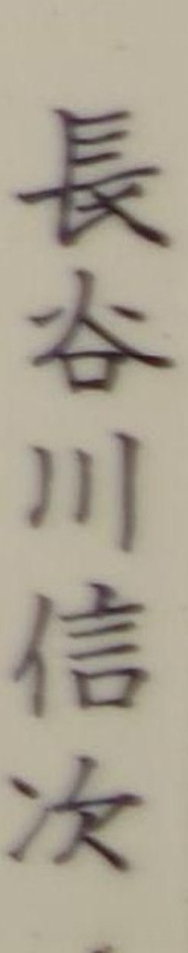長谷川信次
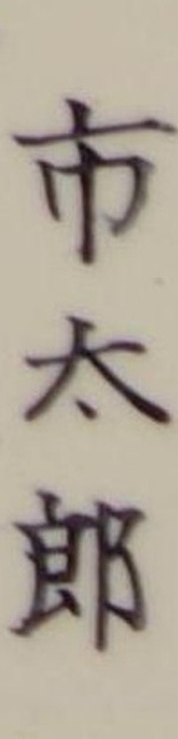市太郎
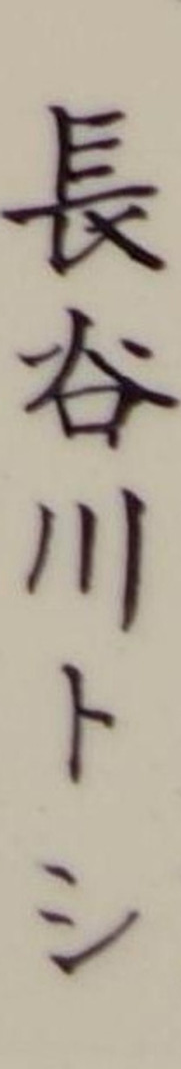長谷川トシ
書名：M~S
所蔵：高野山金剛峯寺
